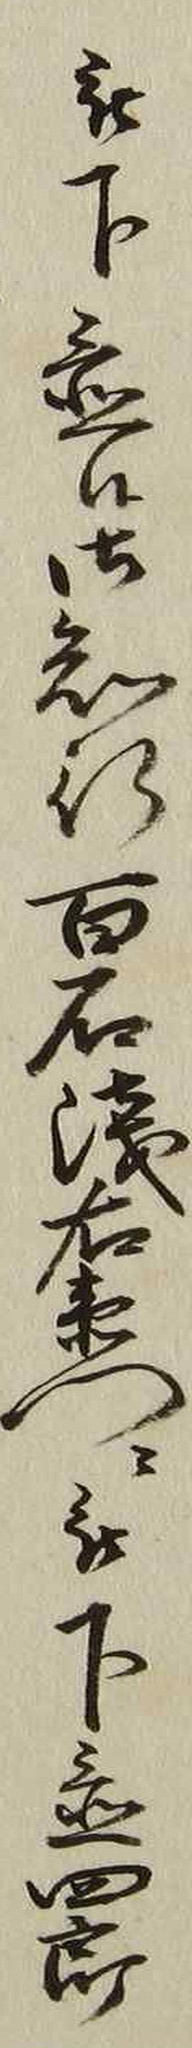被下置候御知行百石浅右衛門ニ被下置四郎
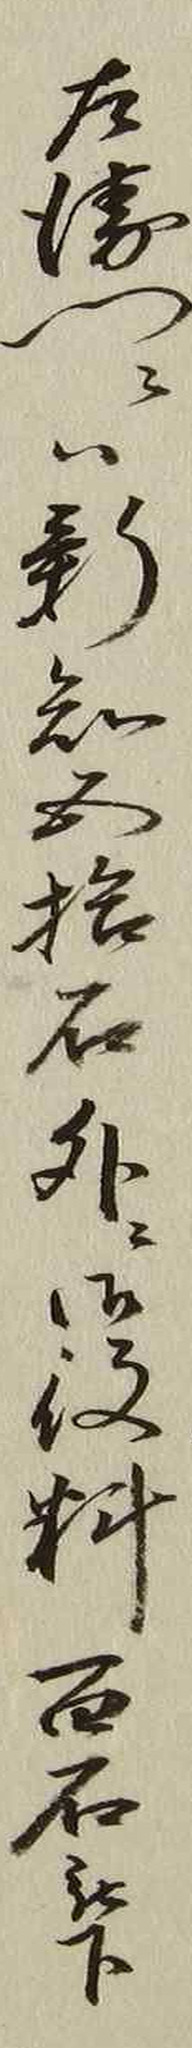左衛門ニハ新知五拾石外ニ御役料百石被下
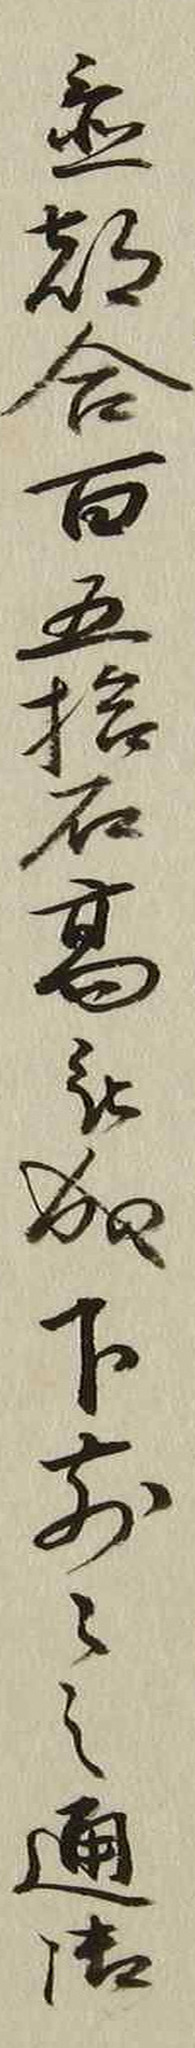置都合百五拾石高被成下前々之通御
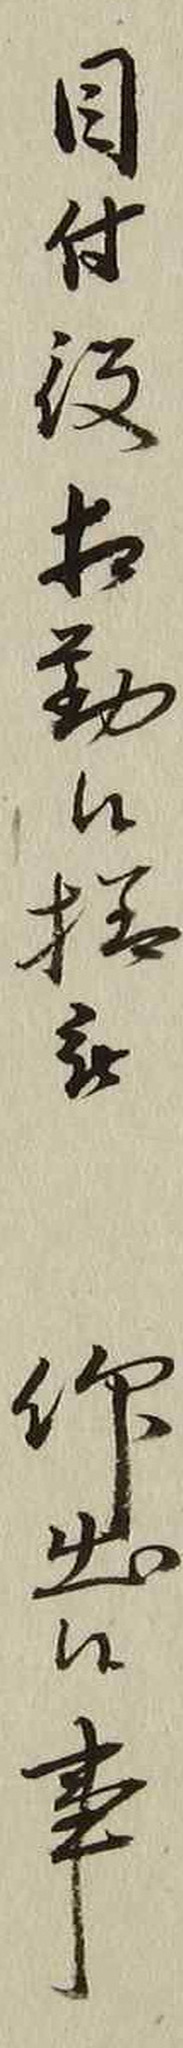目付役相勤候様被仰出候事
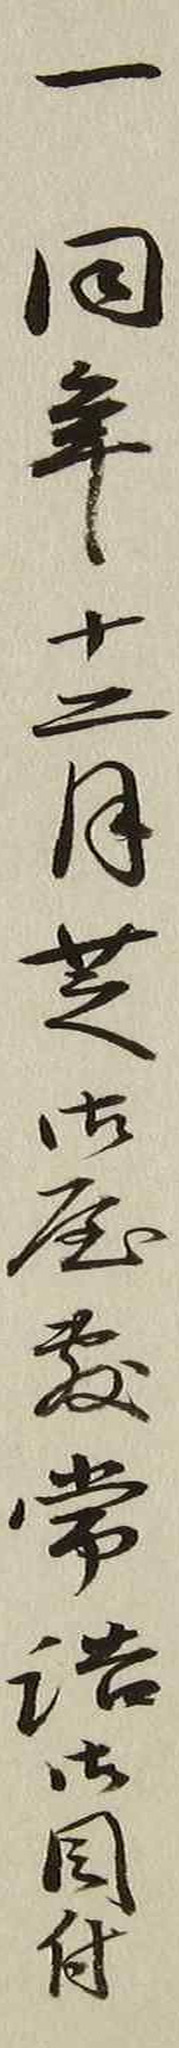一同年十二月芝御屋敷常詰御目付
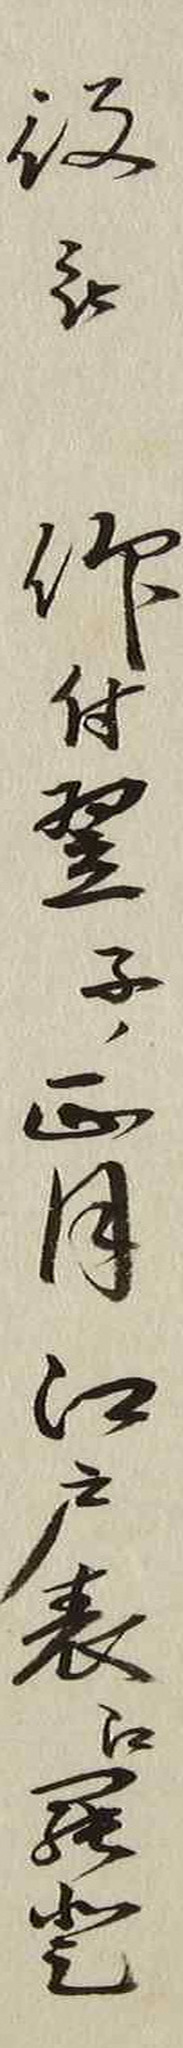役被仰付翌子ノ正月江戸表江罷登
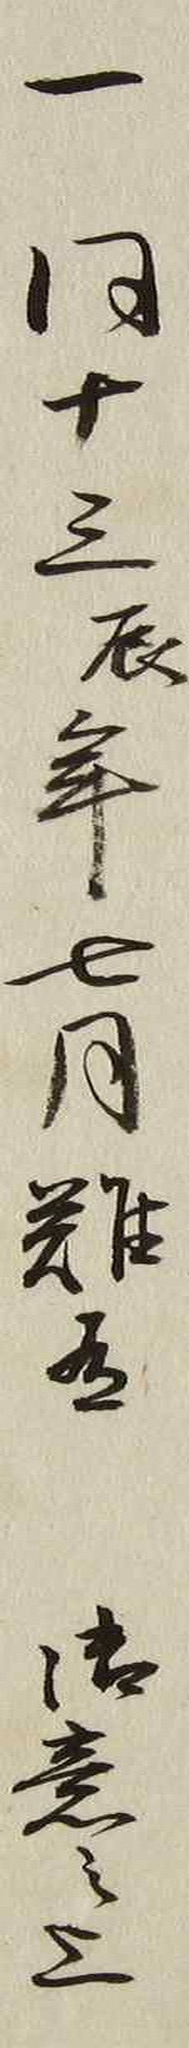一同十三辰年七月難有御意之上
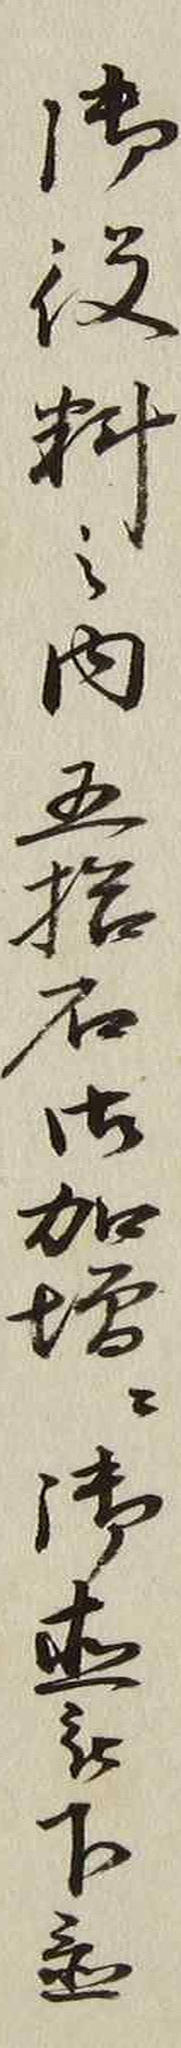御役料之内五拾石御加増ニ御直被下置
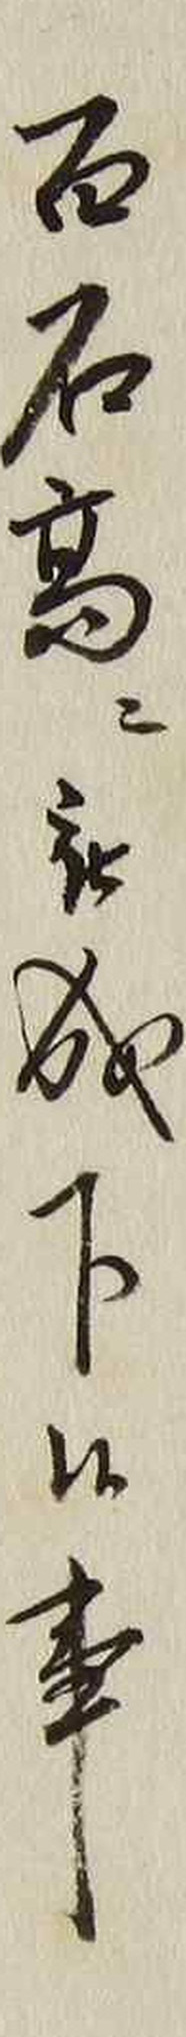百石高ニ被成下候事
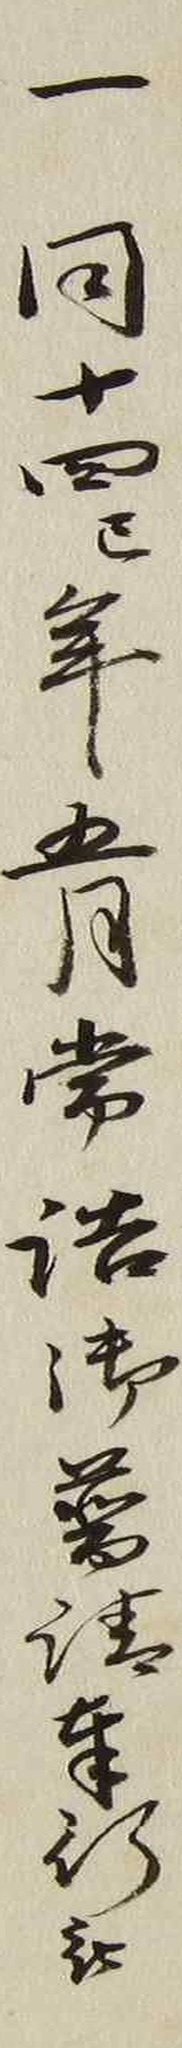一同十四巳年五月常詰御普請奉行被
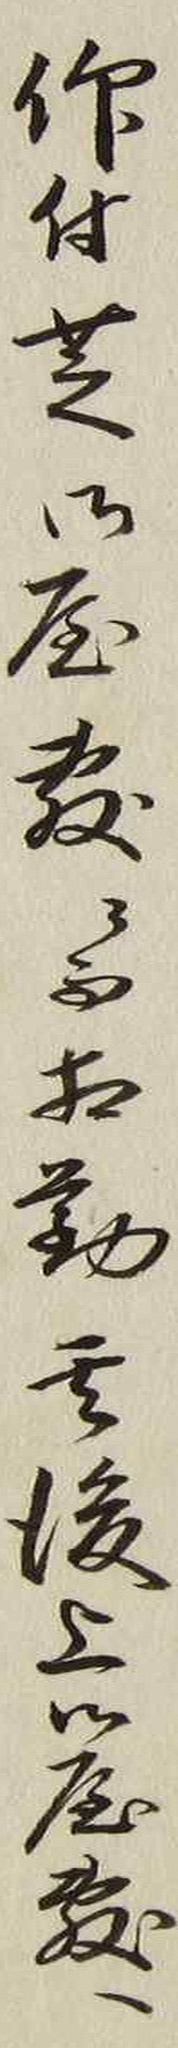仰付芝御屋敷ニ而相勤其後上御屋敷へ
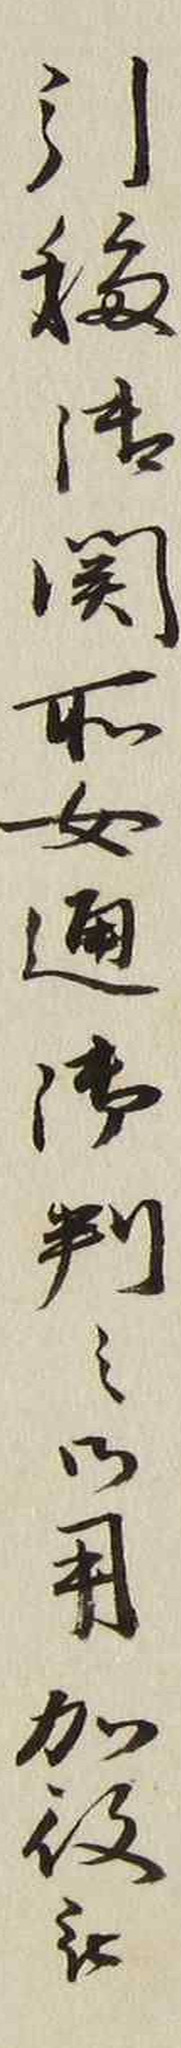引移御関所女通御判之御用加役被
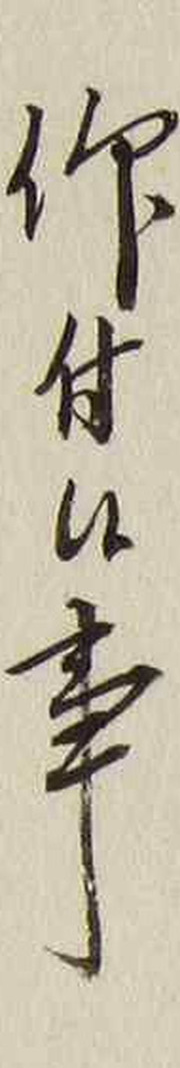仰付候事

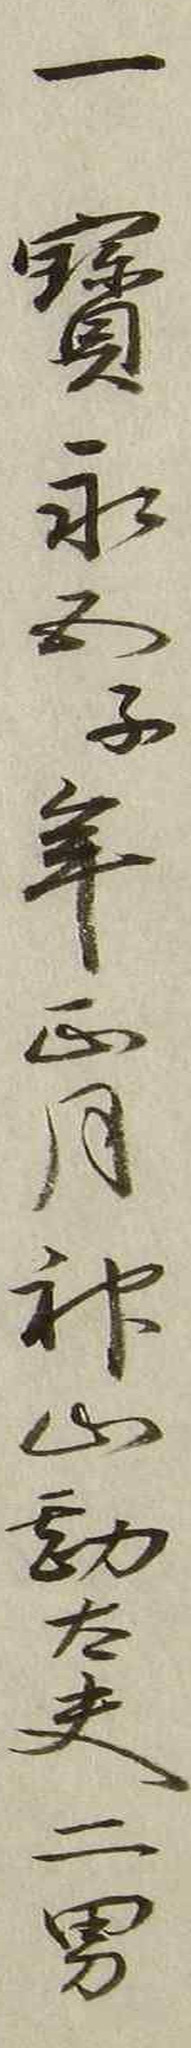一宝永五子年正月神山勘太夫二男
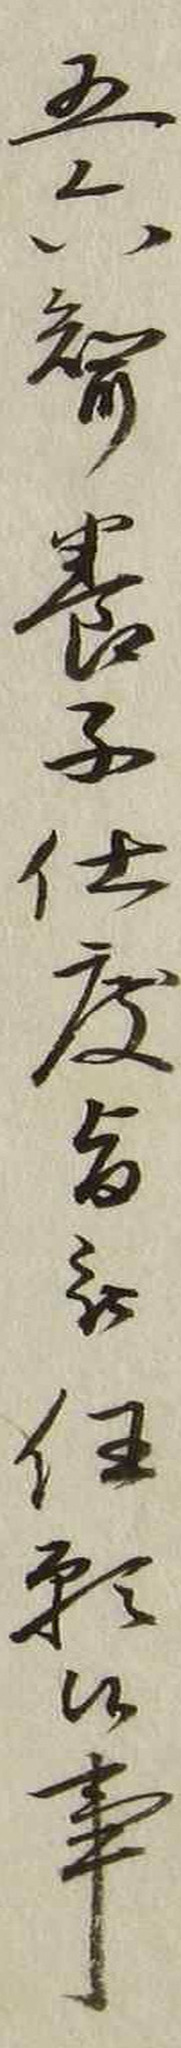五六婿養子仕度旨被任願候事
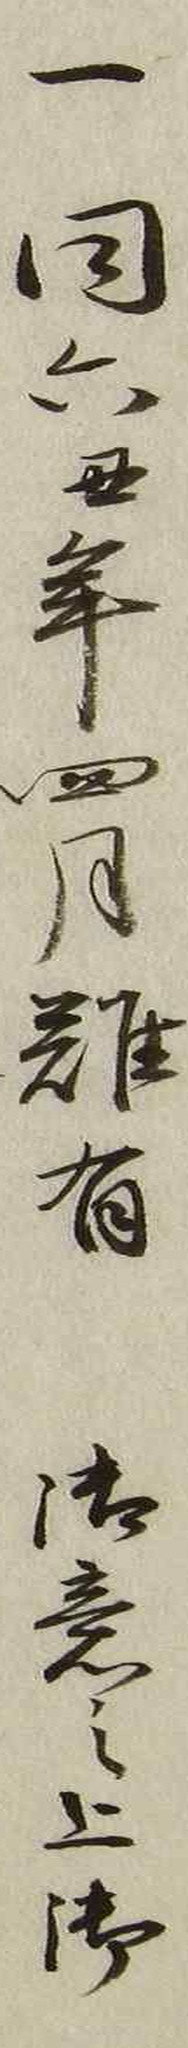一同六丑年四月難有御意之上御
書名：諸士系譜　巻之149　そ之部2
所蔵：会津若松市立会津図書館
